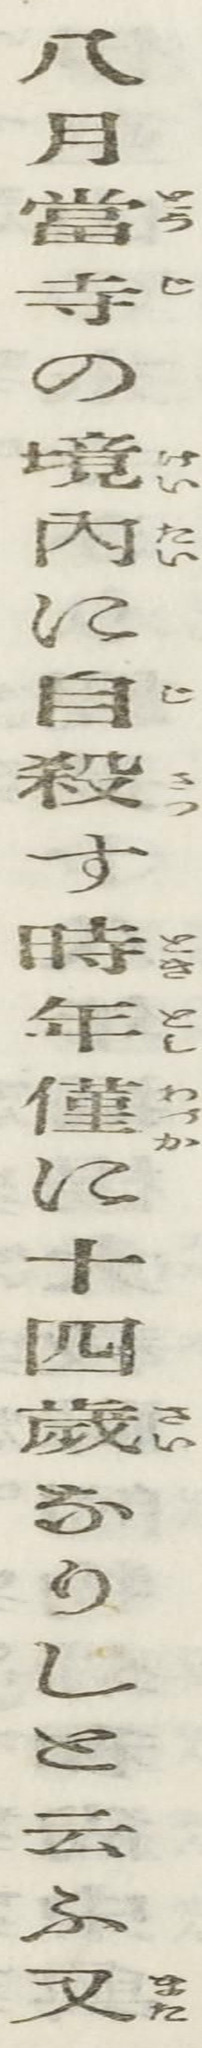八月当寺の境内に自殺す時年僅に十四歳なりしと云ふ又
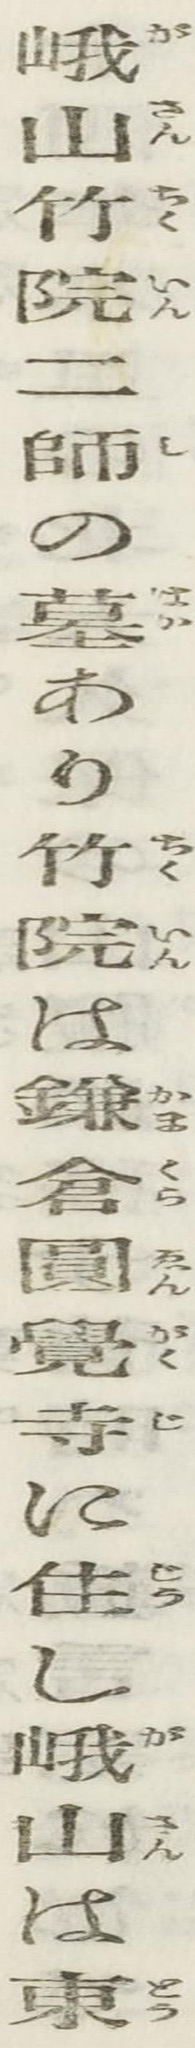峨山竹院二師の墓あり竹院は鎌倉圓覚寺に住し峨山は東
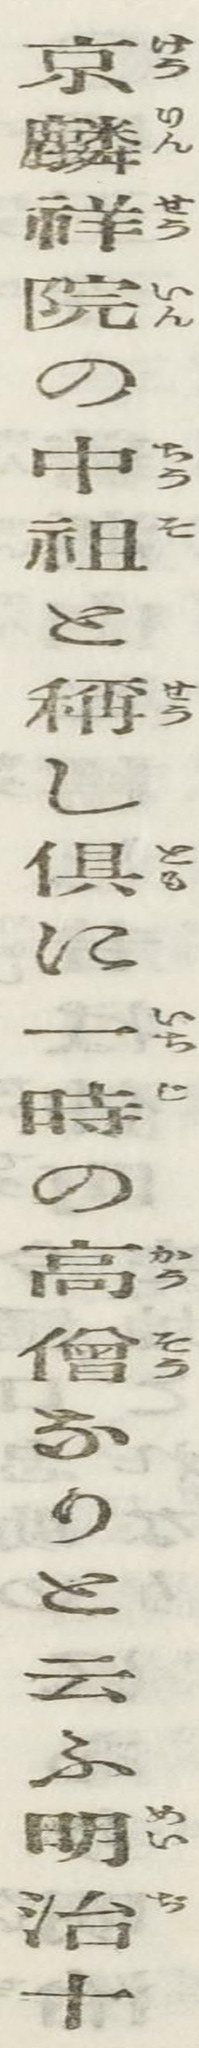亰麟祥院の中祖と称し倶に一時の高僧なりと云ふ明治十
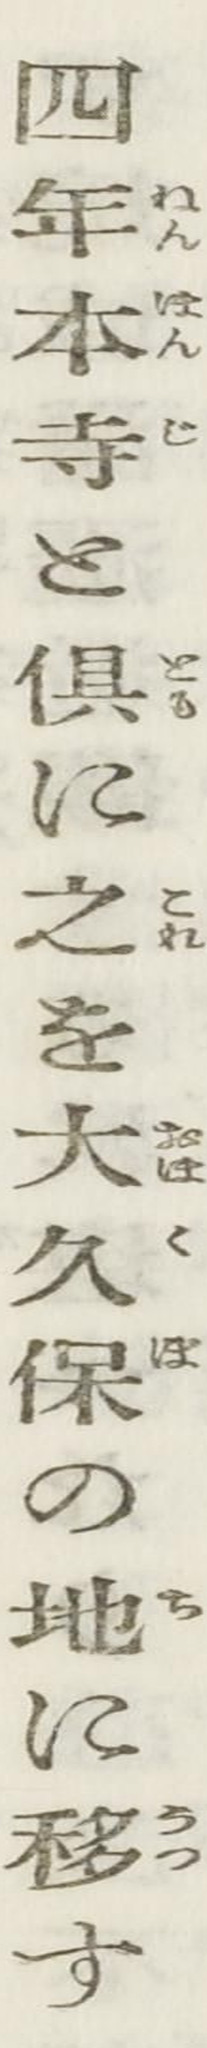四年本寺と倶に之を大久保の地に移す
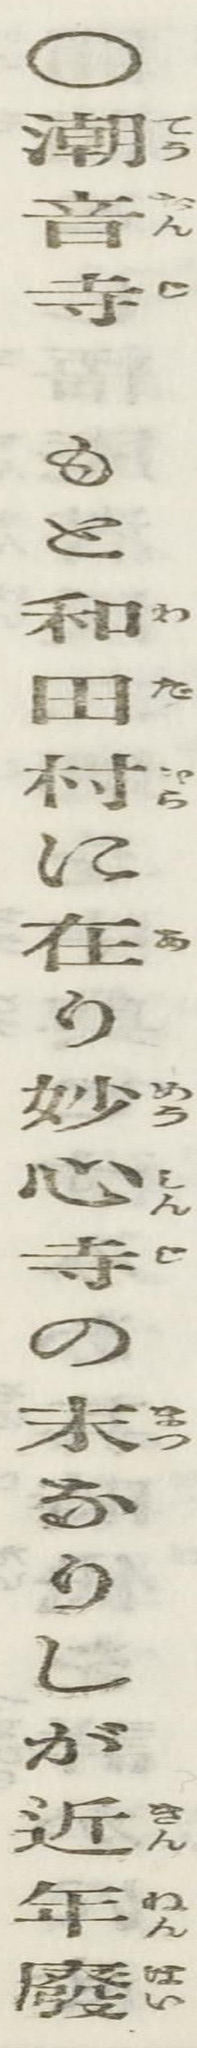○潮音寺もと和田村に在り妙心寺の末なりしが近年廃
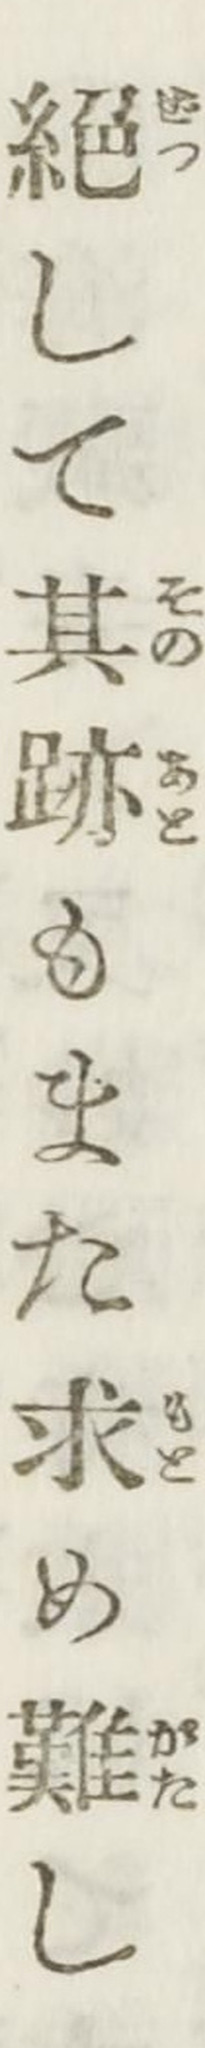絶して其跡もまた求め難し
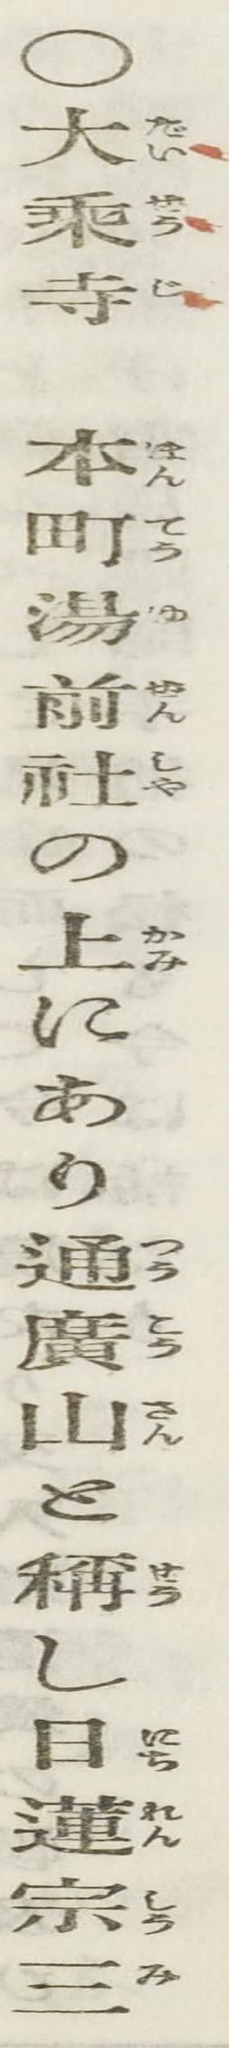○大乗寺本町湯前社の上にあり通廣山と称し日蓮宗三
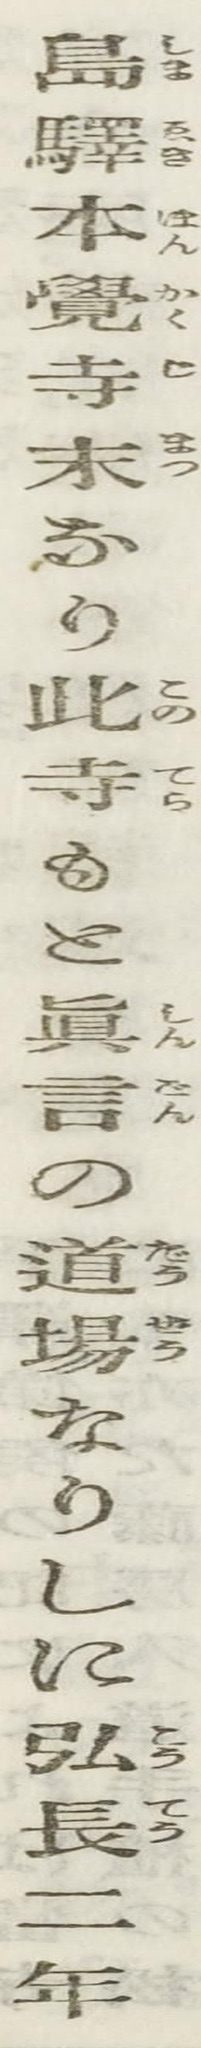島駅本覚寺末なり此寺もと眞言の道場なりしに弘長二年
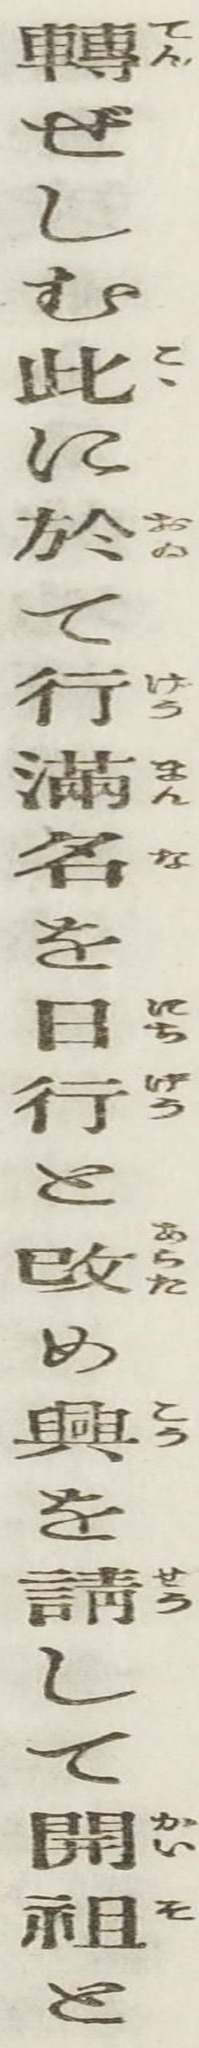転ぜしむ此に於て行満名を日行と改め興を請して開祖と
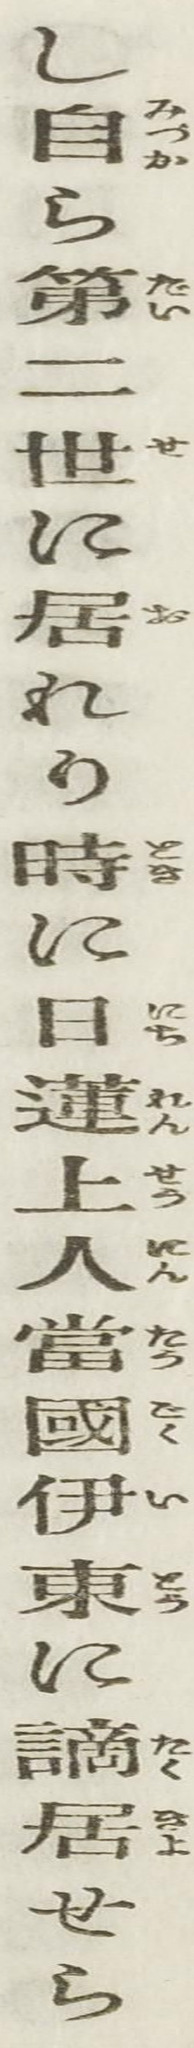し自ら第二世に居れり時に日蓮上人当国伊東に謫居せら
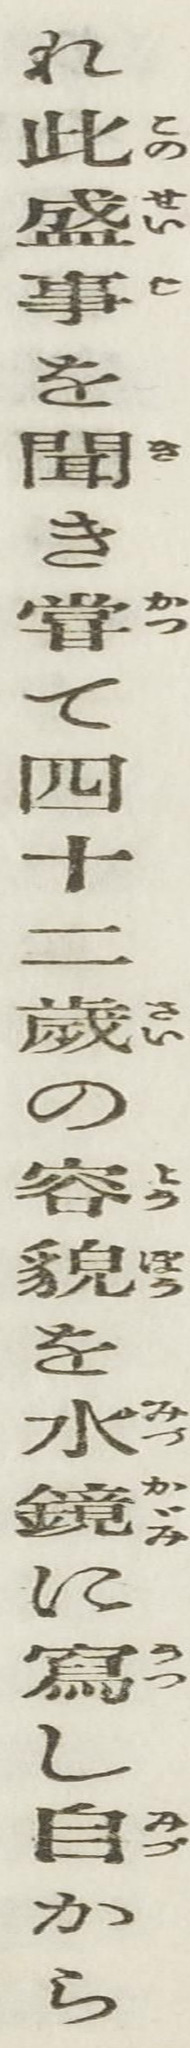れ此盛事を聞き嘗て四十二歳の容貌を水鏡に写し自から
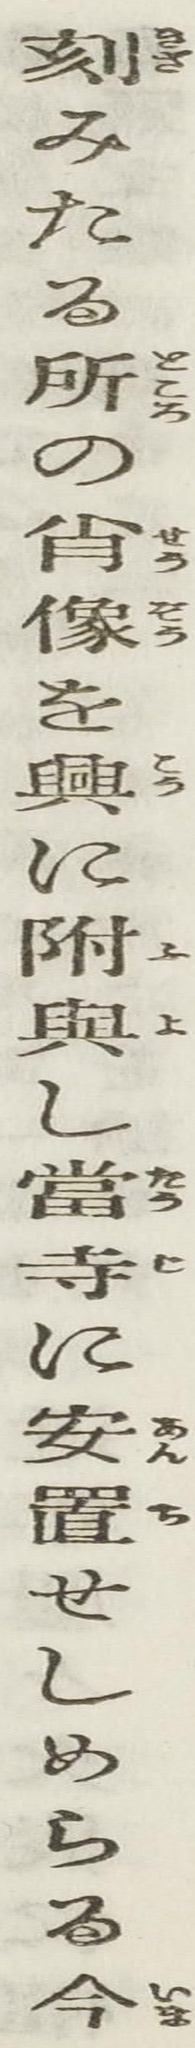刻みたる所の肖像を興に付与し当寺に安置せしめらる今
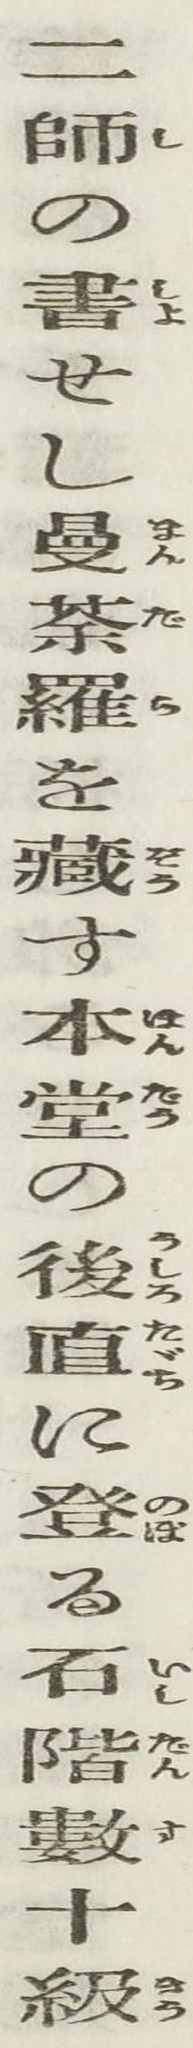二師の書せし曼荼羅を蔵す本堂の後直に登る石階数十級
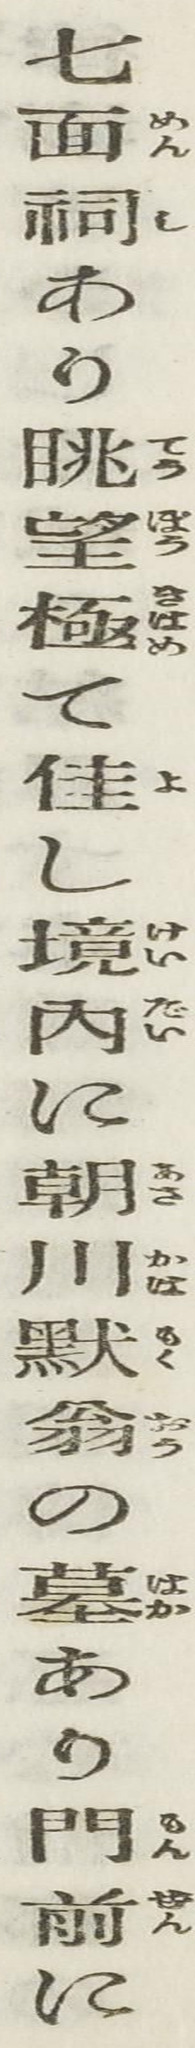七面祠あり眺望極て佳し境内に朝川黙翁の墓あり門前に
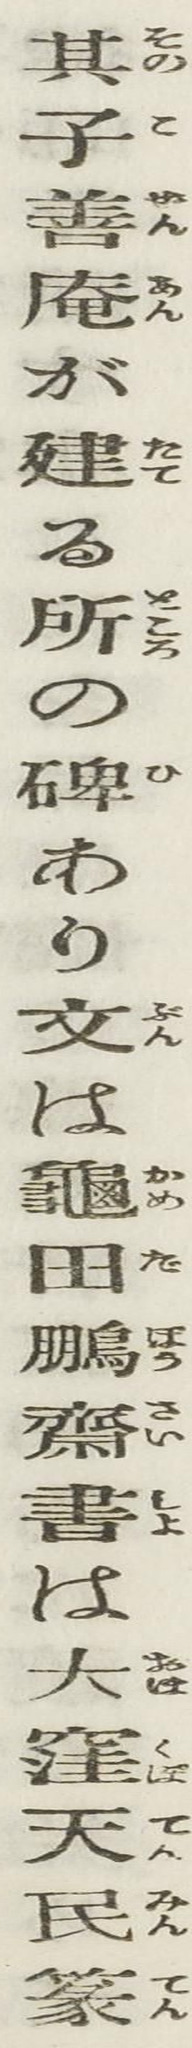其子善庵が建る所の碑あり文は亀田鵬斎書は大窪天民篆
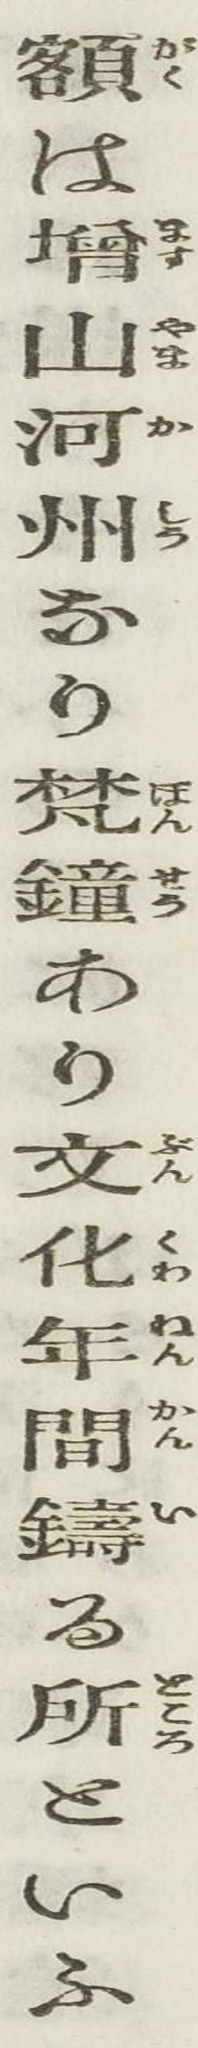額は増山河州なり梵鐘あり文化年間鋳る所といふ
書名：熱海獨案内　全
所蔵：東京大学地震研究所図書室 Earthquake Research Institute Library, The University of Tokyo, JAPAN
